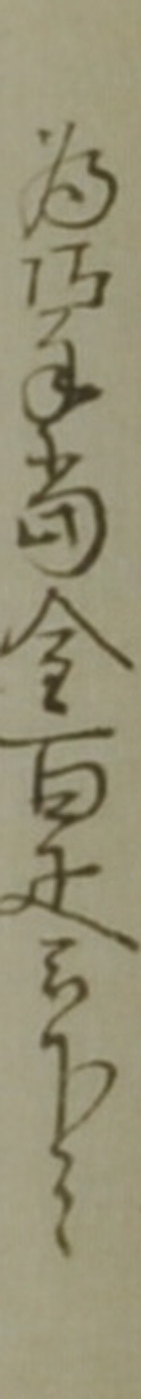為御手当金百疋被下之
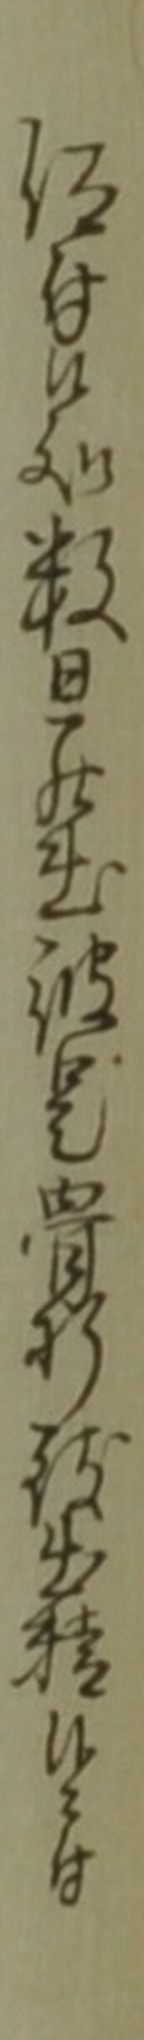仰付候処数日罷出彼是骨折致出精候ニ付
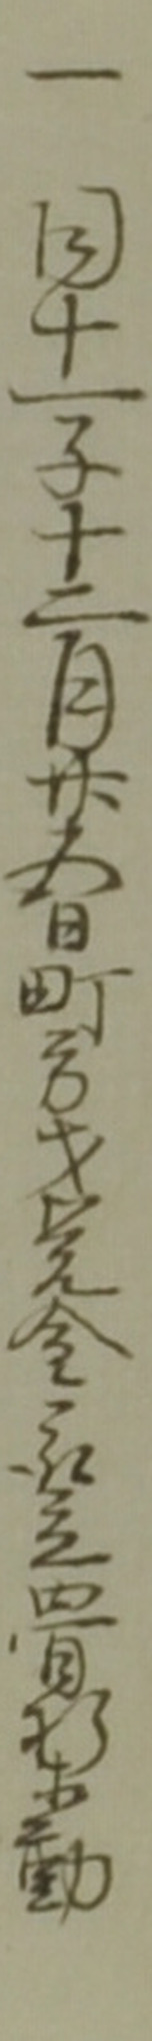一同十一子十二月廿五日町方才覚金取立骨折相勤
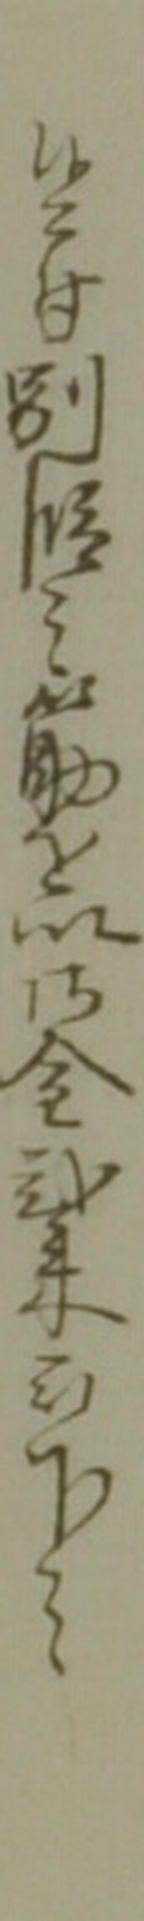候ニ付別段之筋を以御金弐来被下之
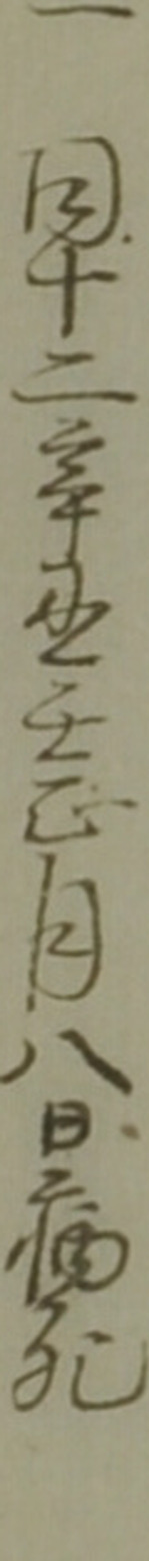一同十二辛丑閏正月八日病死
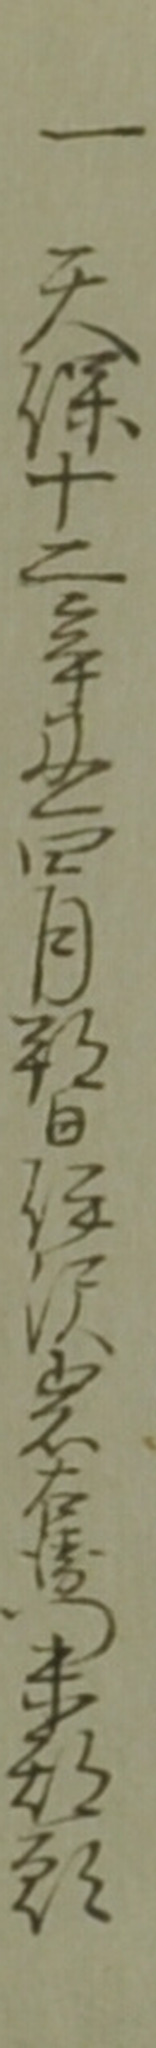一天保十二辛丑四月朔日伊沢岩右衛門末期願
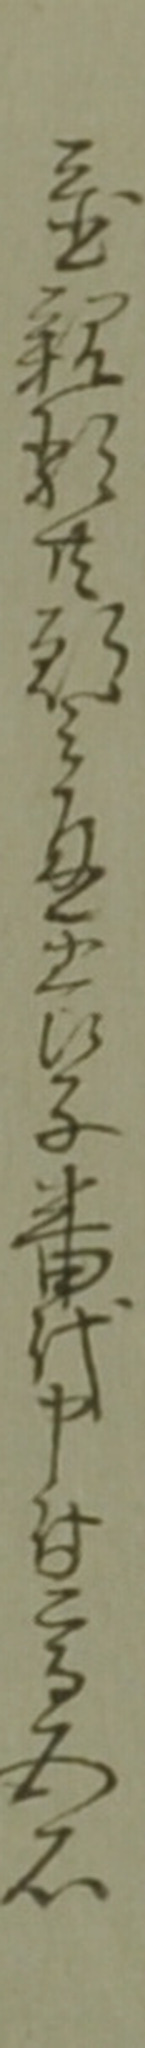置親類共願之通養子番代申付高五石
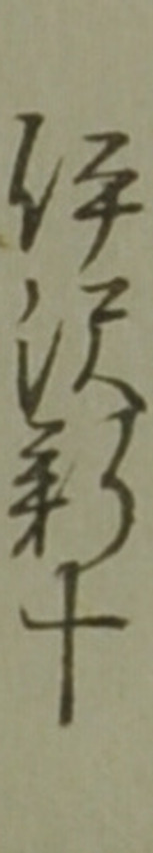伊沢新十
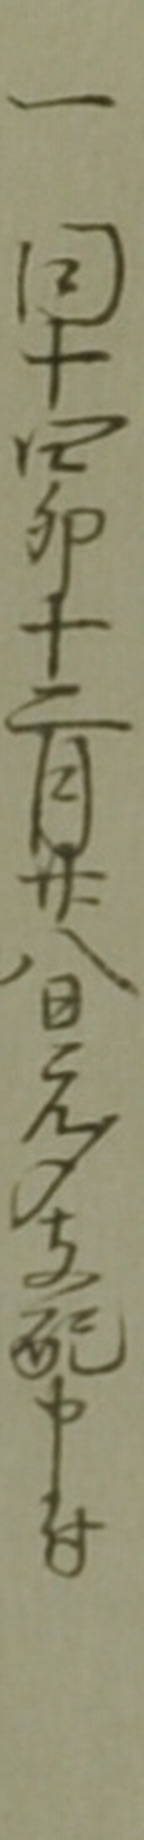一同十四卯十二月廿八日元〆支配申付
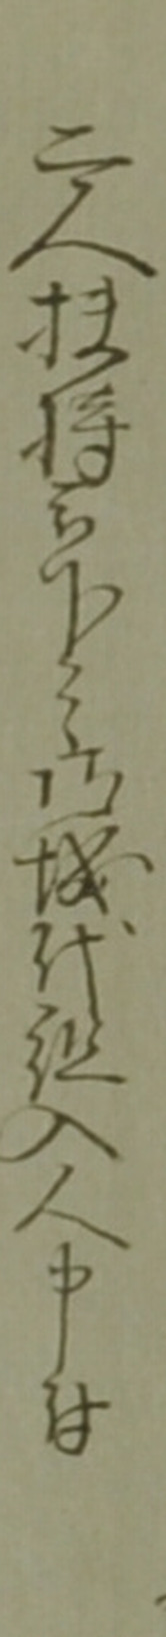二人扶持被下之御城代組入人申付
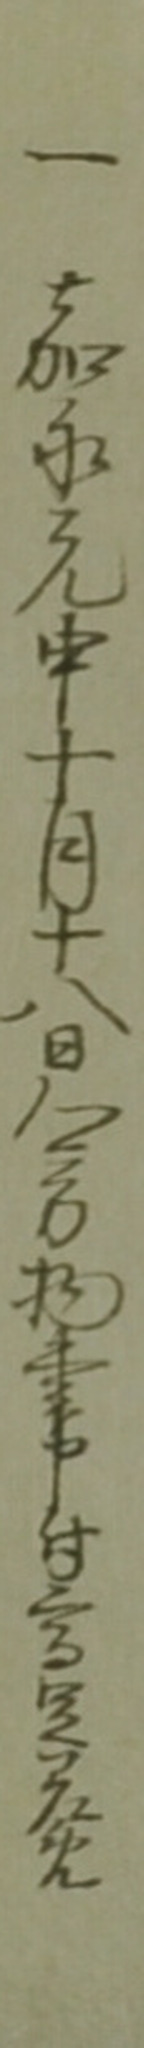一嘉永元申十月十八日郷方物書申付高足差免

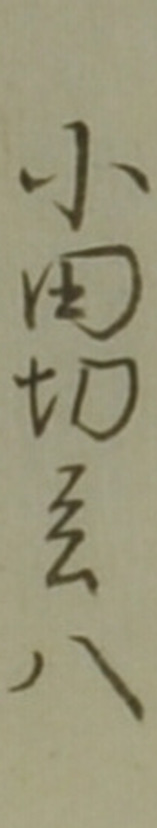小田切兵八
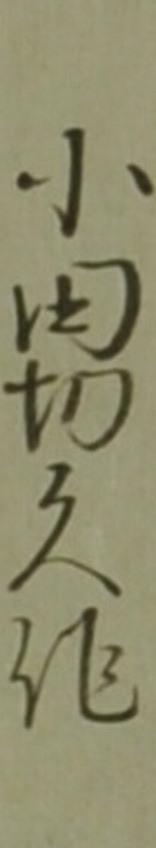小田切久作

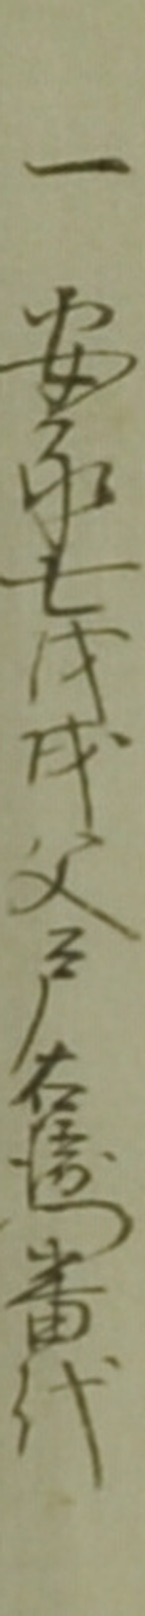一安永七戊戌父戸右衛門番代
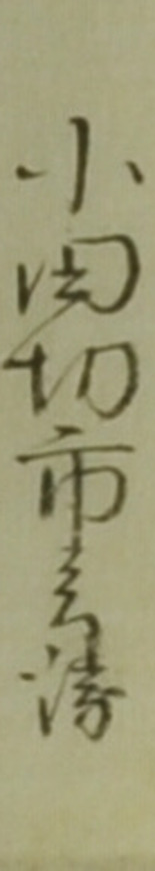小田切市兵衛
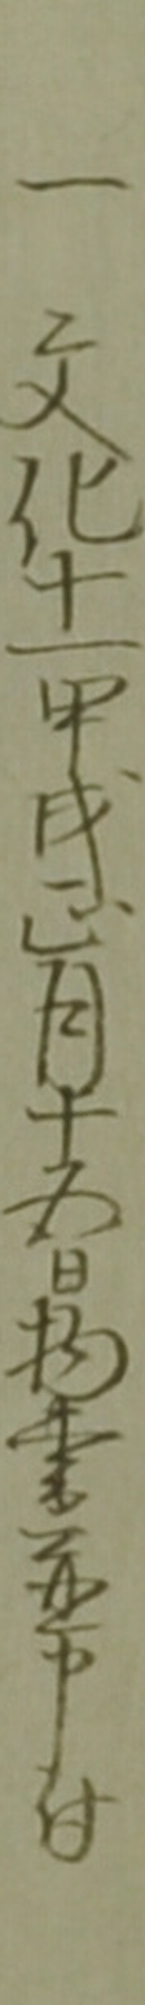一文化十一甲戌正月十五日物書並申付
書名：無足諸士勤仕録（九）
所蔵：伊那市立高遠町図書館・合同会社AMANE
